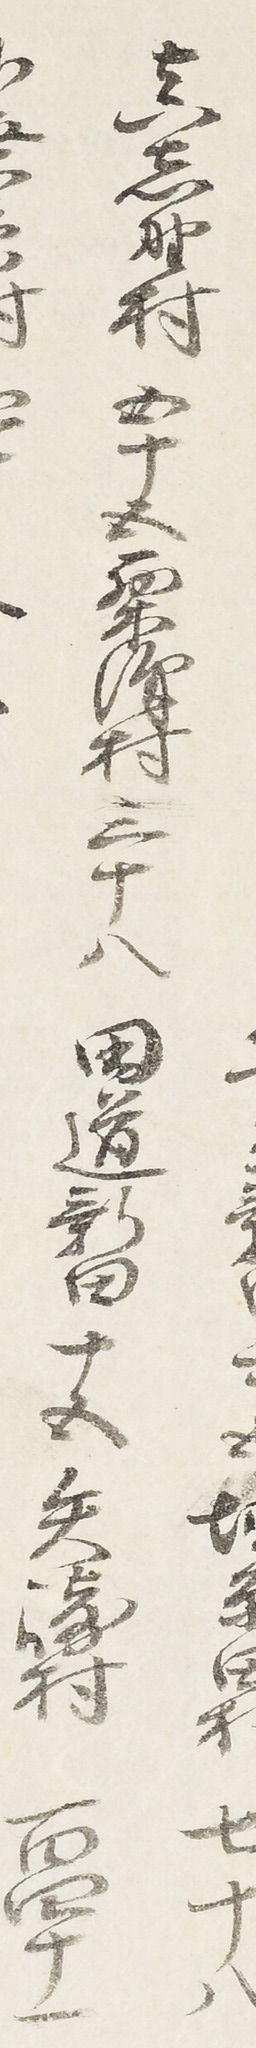真志野村四十五栗沢村三十八田道新田十五矢崎村百四十一
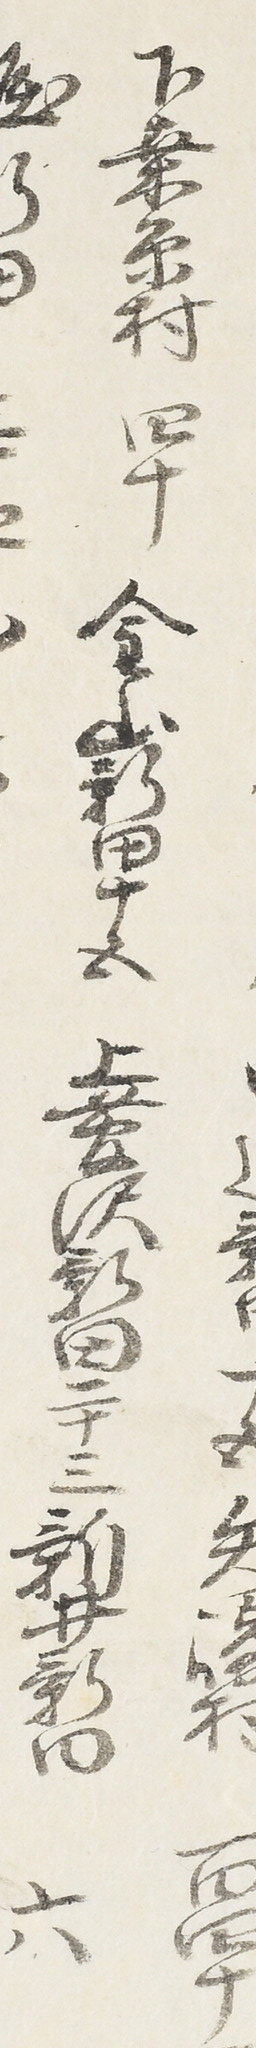下桑原村四十金山新田十五上菅沢新田二十三新井新田六
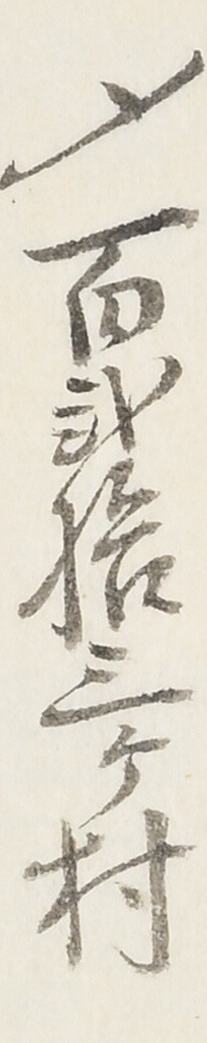〆百弐拾三ヶ村
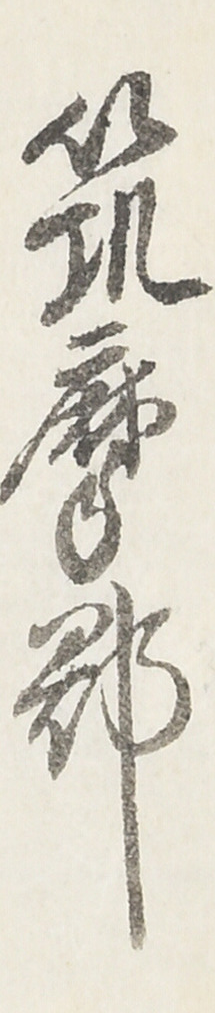筑摩郡

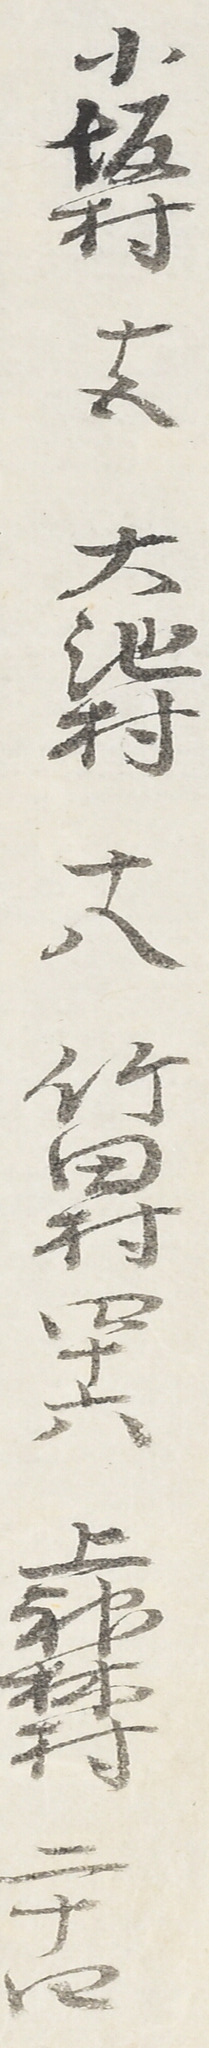小坂村十五大池村十八竹田村四十六上神林村二十四

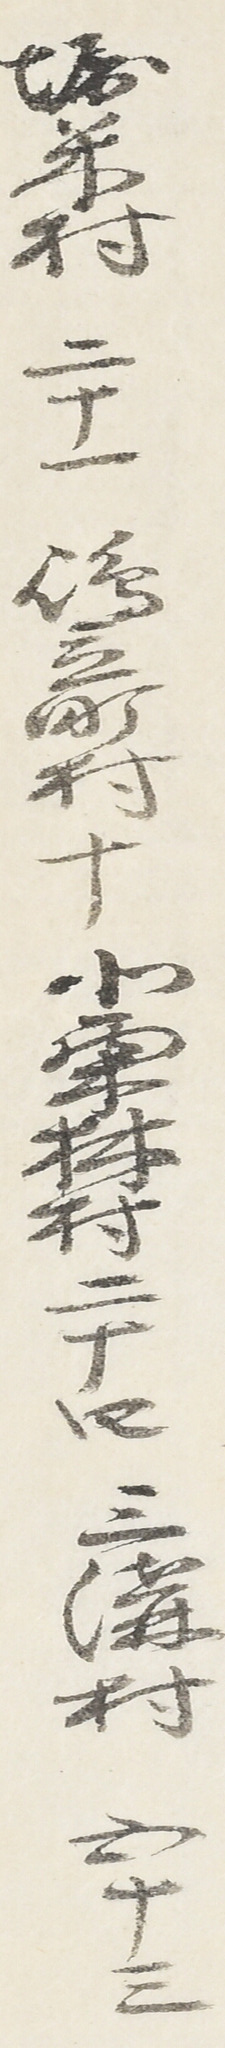堀米村二十一嶋立町村十北東林村二十四三溝村五十三
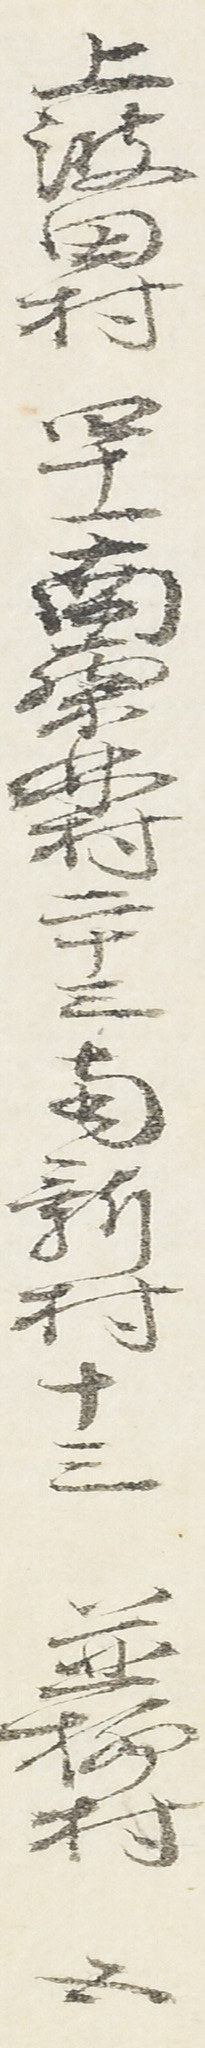上波田村四十一南栗林村二十三南新村十三並柳村五
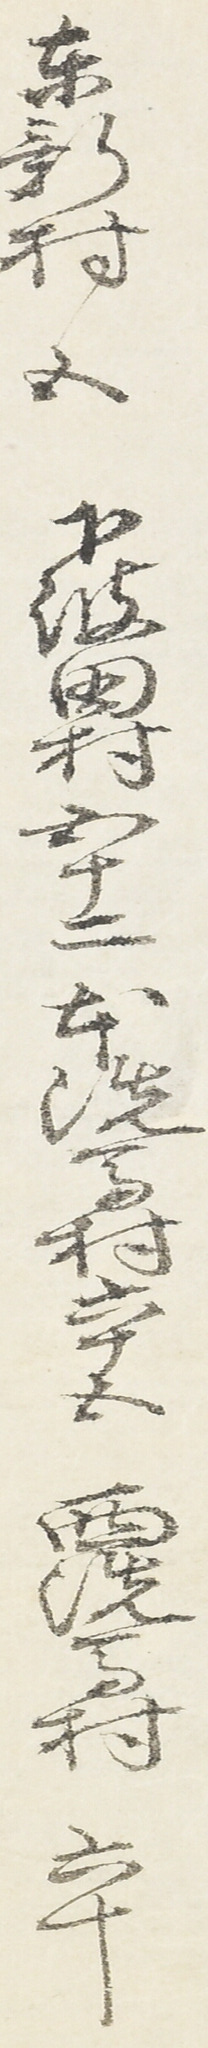東新村五下波田村五十二本洗馬村六十五西洗馬村六十
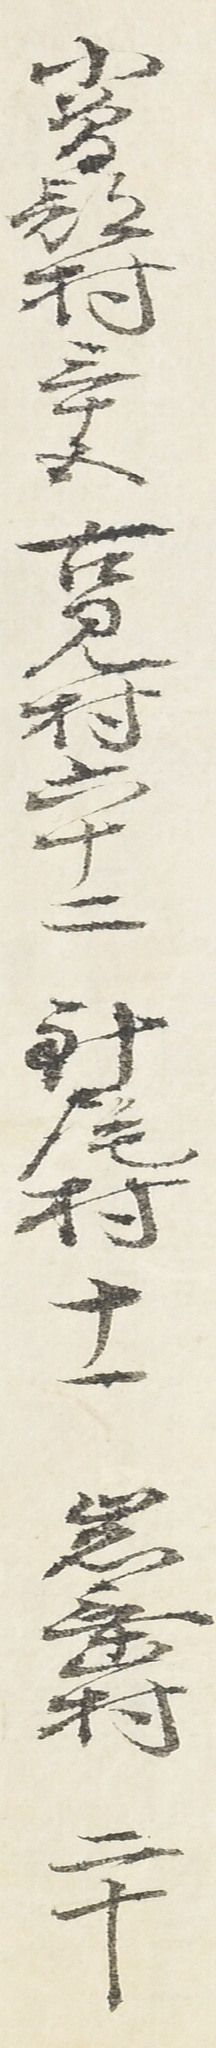小曽部村三十五古見村六十二針尾村十一岩垂村二十
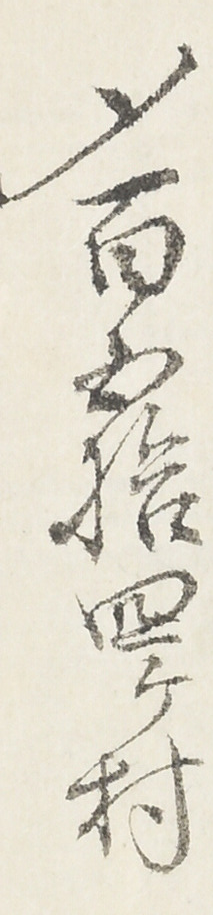〆百五拾四ヶ村
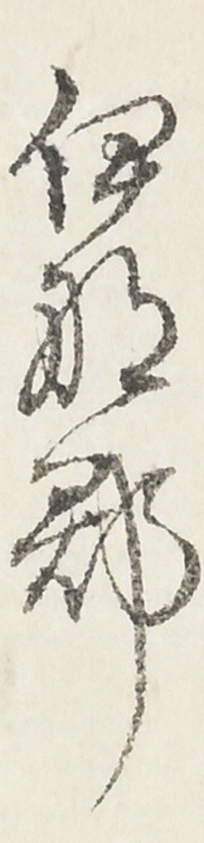伊那郡
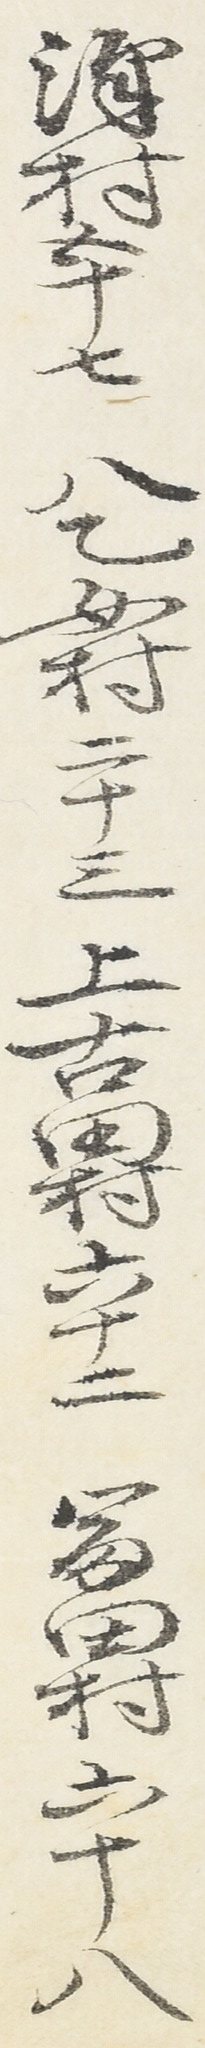沢村五十七八乙女村二十三上古田村六十二冨田村六十八

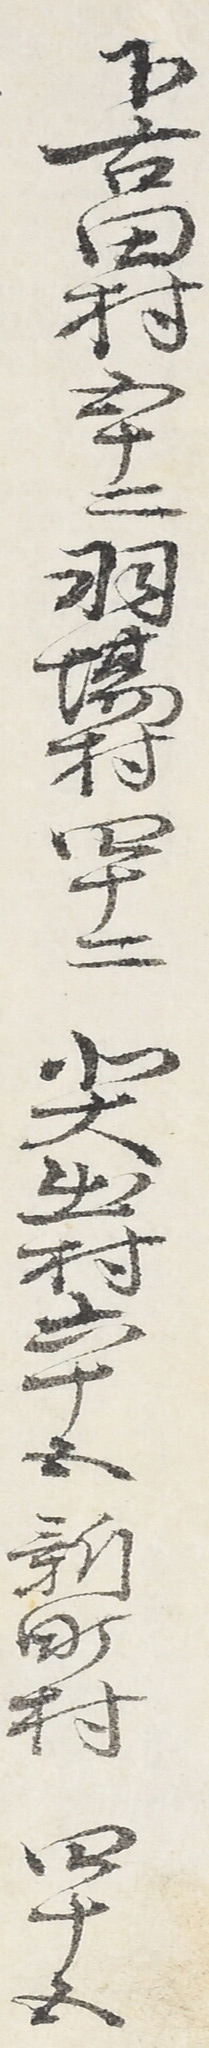下古田村五十二羽場村四十二北大出村六十五新町村四十五
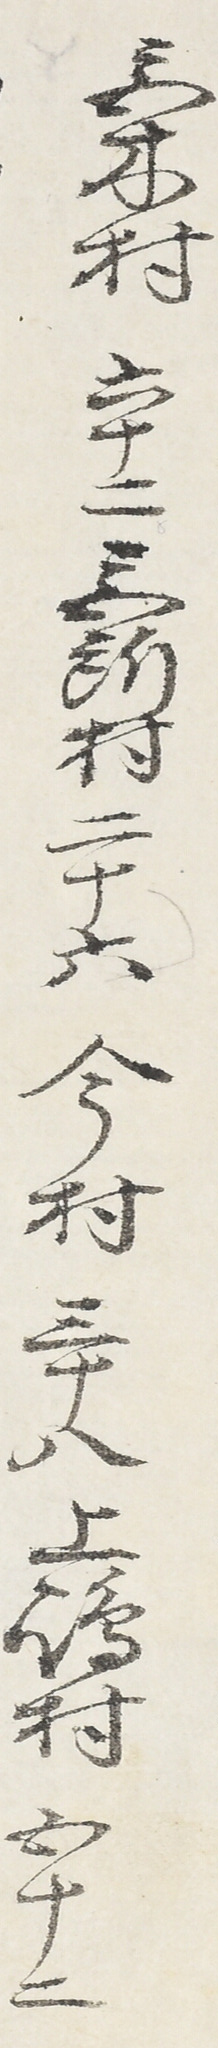宮木村六十二宮新村二十六今村三十八上嶋村五十二
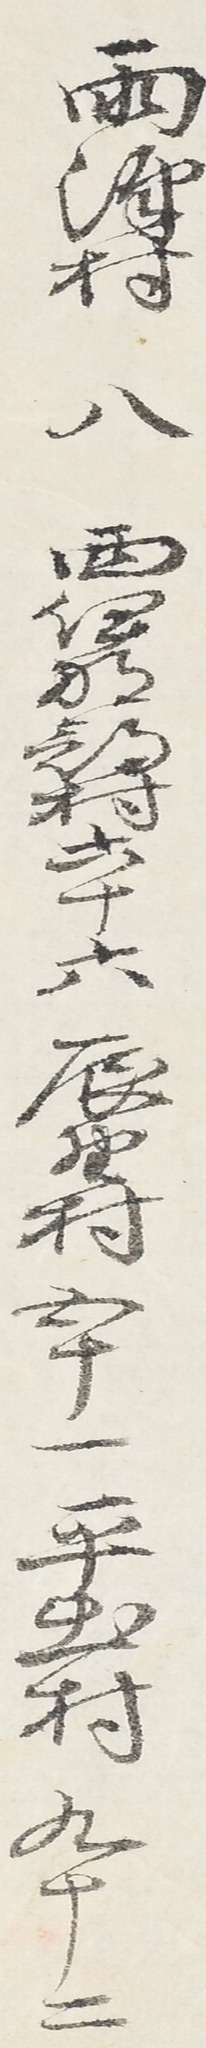両沢村八西伊那部村六十六辰野村五十一平出村九十二
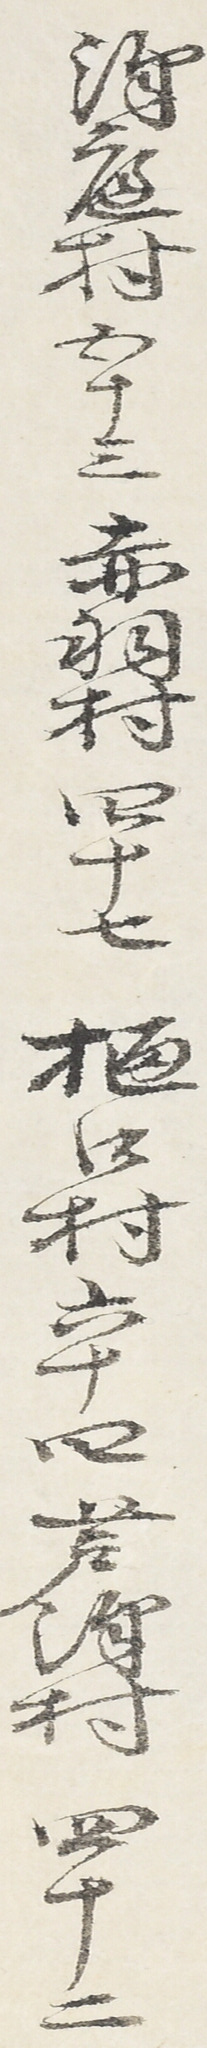沢庭村五十三赤羽村四十七樋口村六十四芦沢村四十二
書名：中馬御裁許帳面
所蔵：伊那市立高遠町図書館・合同会社AMANE
